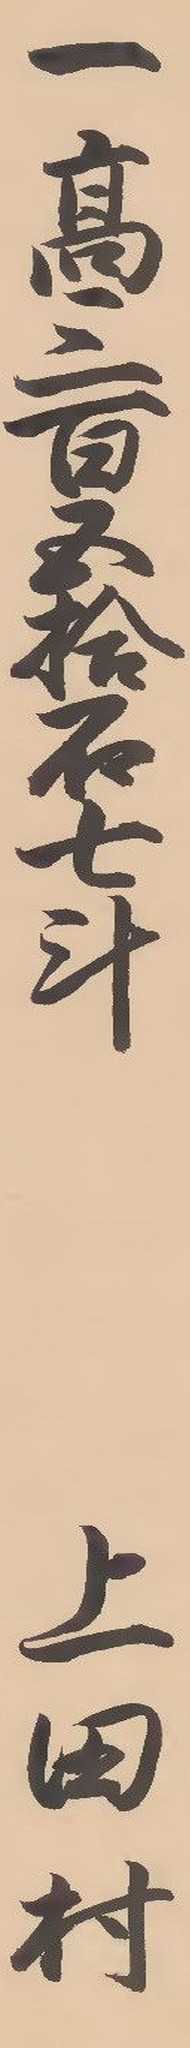一高三百五拾石七斗上田村
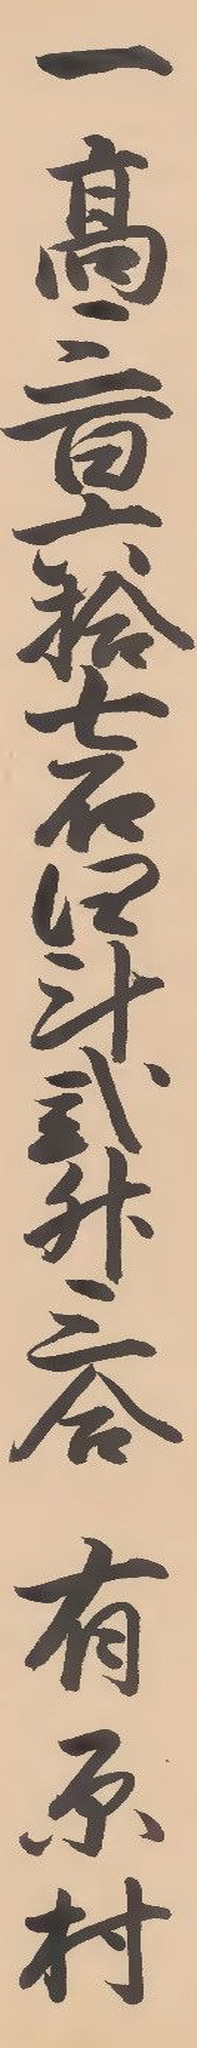一高三百六拾七石四斗弐升三合有原村

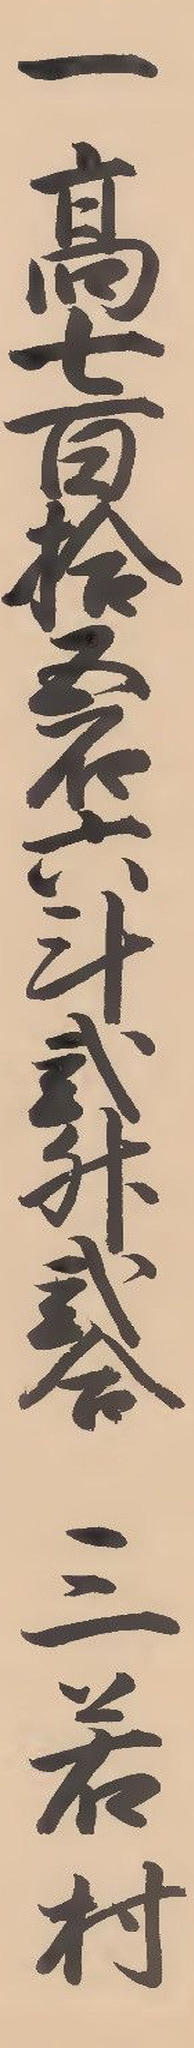一高七百拾五石六斗弐升弐合三若村
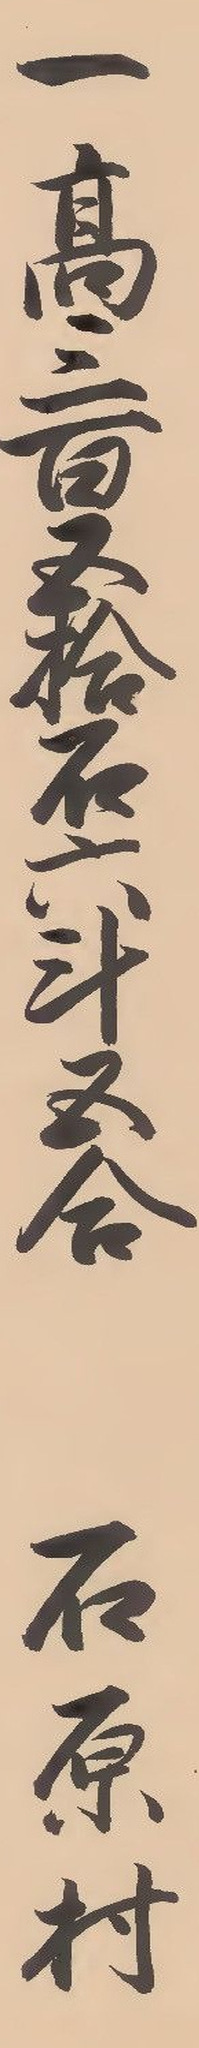一高三百五拾石六斗五合石原村
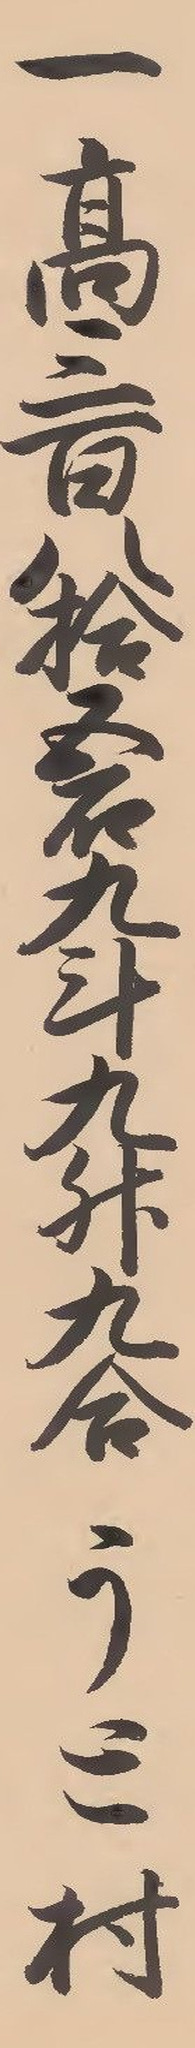一高三百八拾五石九斗九升九合うと村
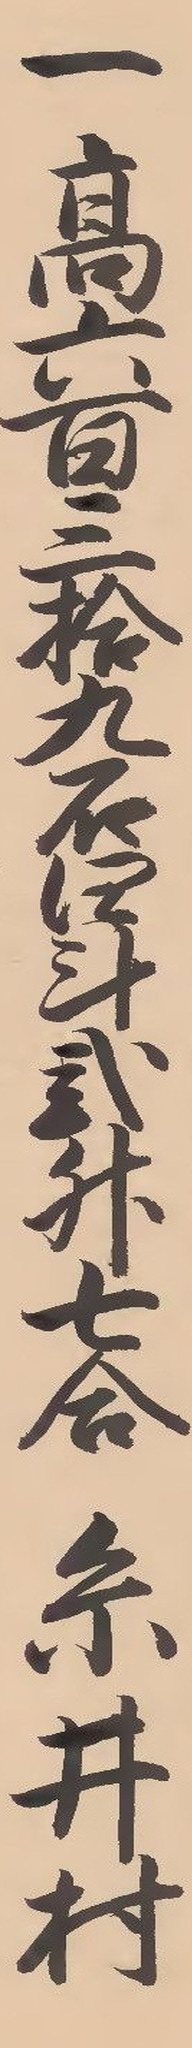一高六百三拾九石四斗弐升七合糸井村
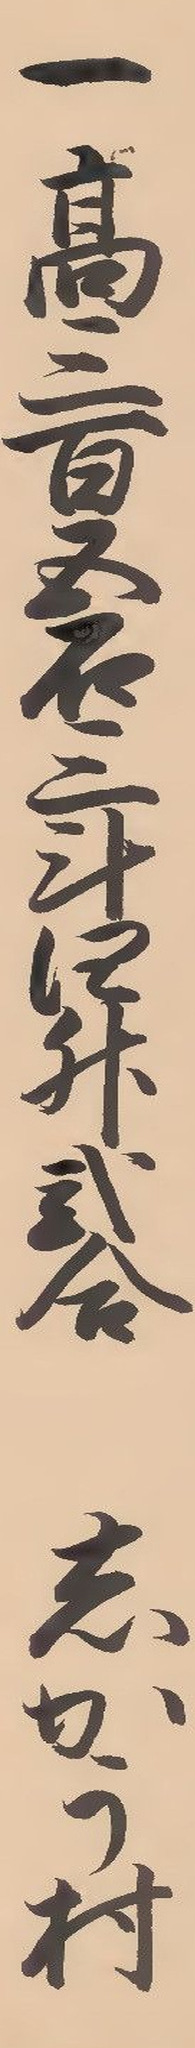一高三百五石三斗四升弐合しかう村
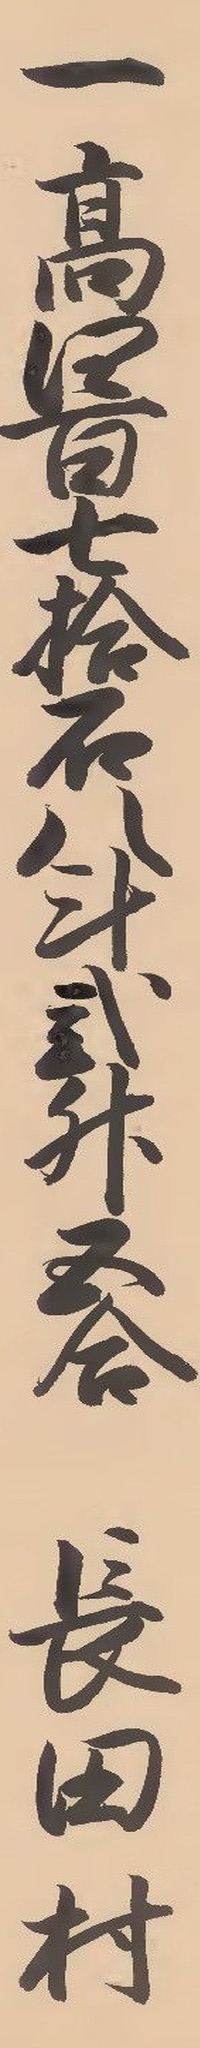一高四百七拾石八斗弐升五合長田村
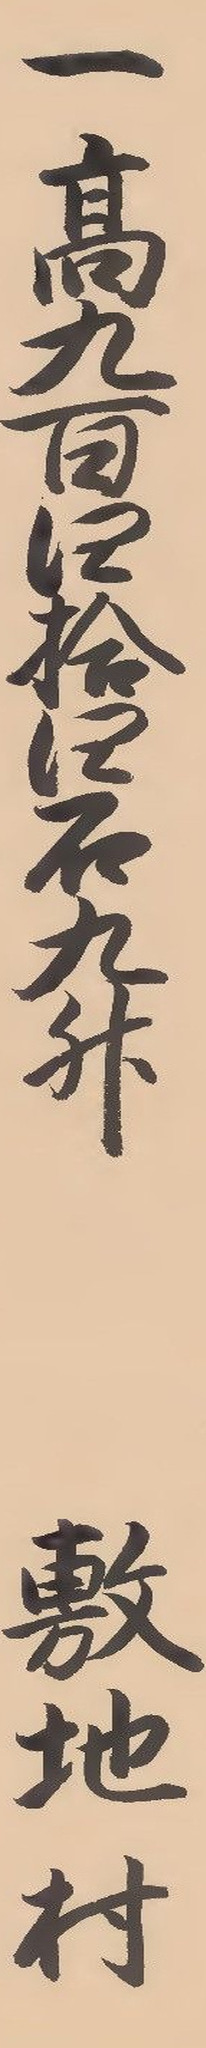一高九百四拾四石九升敷地村
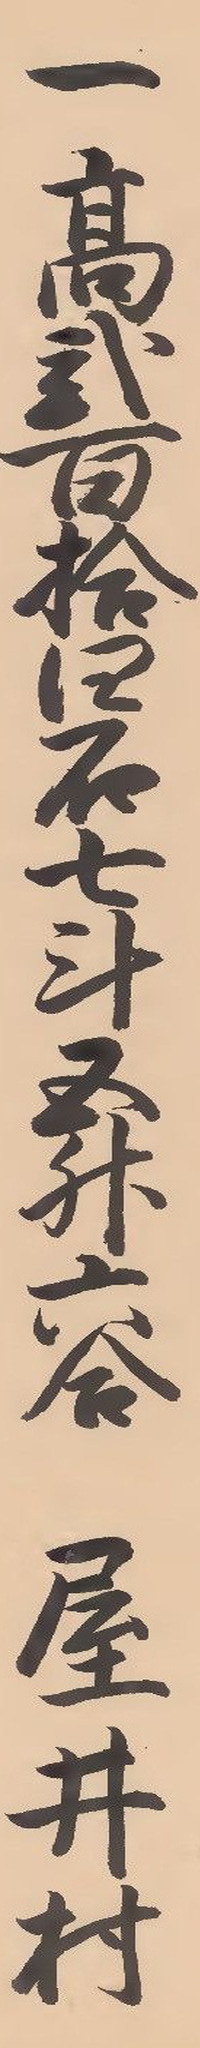一高弐百拾四石七斗五升六合屋井村

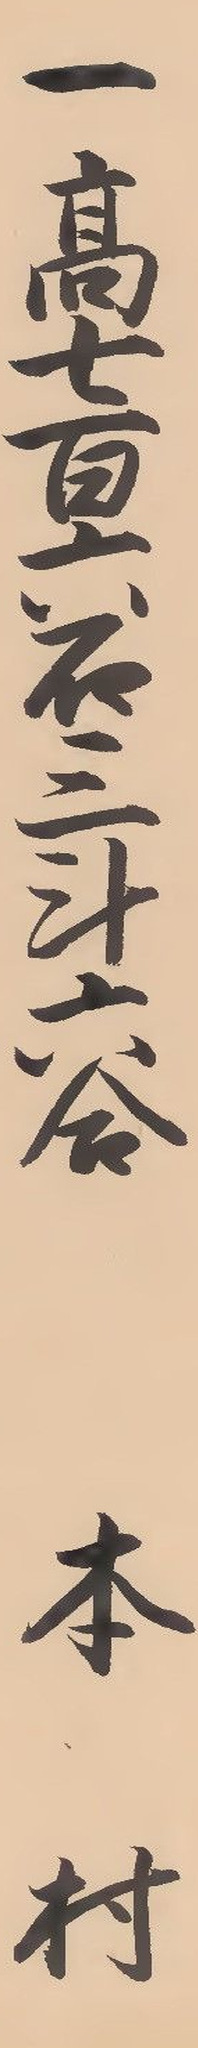一高七百六石三斗六合本村
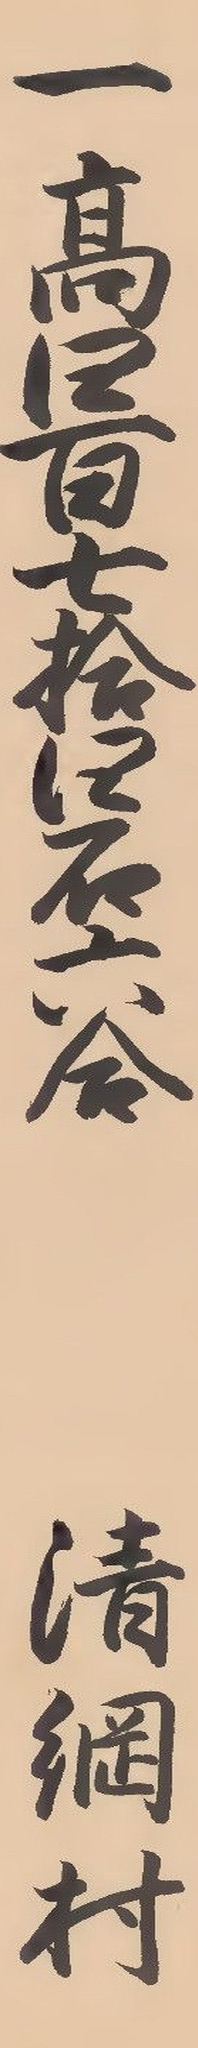一高四百七拾四石六合清綱村
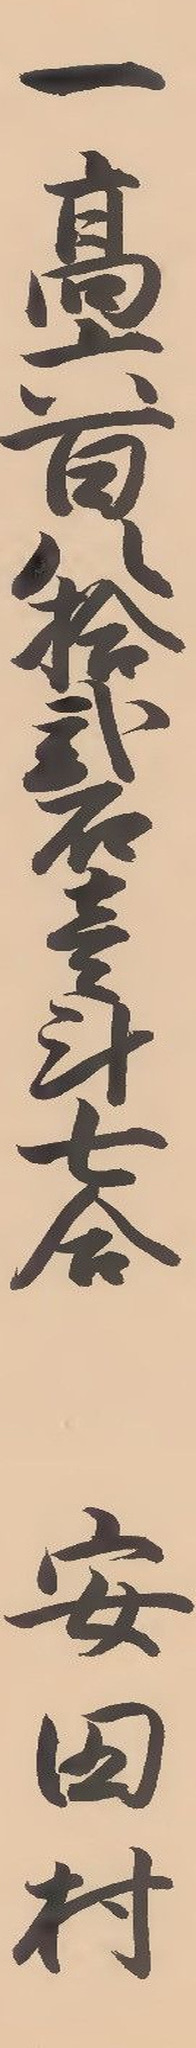一高六百八拾弐石壱斗七合安田村
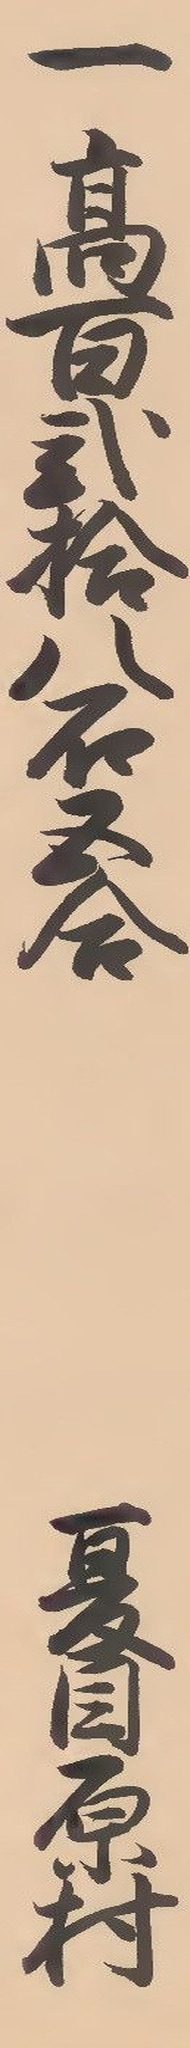一高百弐拾八石五合夏目原村
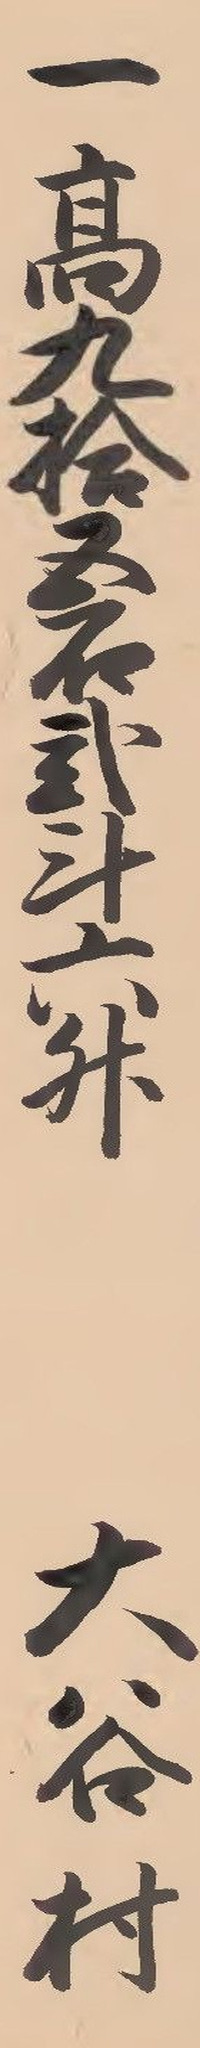一高九拾五石弐斗六升大谷村
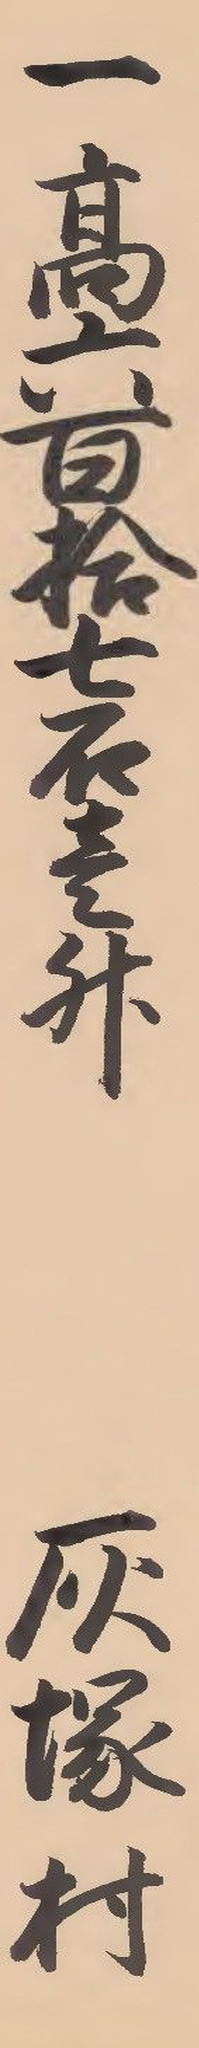一高六百拾七石壱升灰塚村
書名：備後国郷帳
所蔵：国立公文書館 National Archives of Japan
